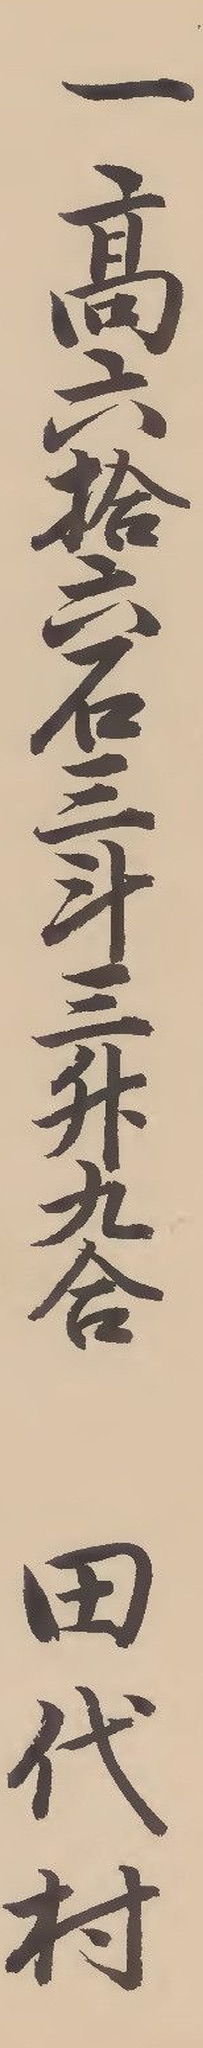一高六拾六石三斗三升九合田代村
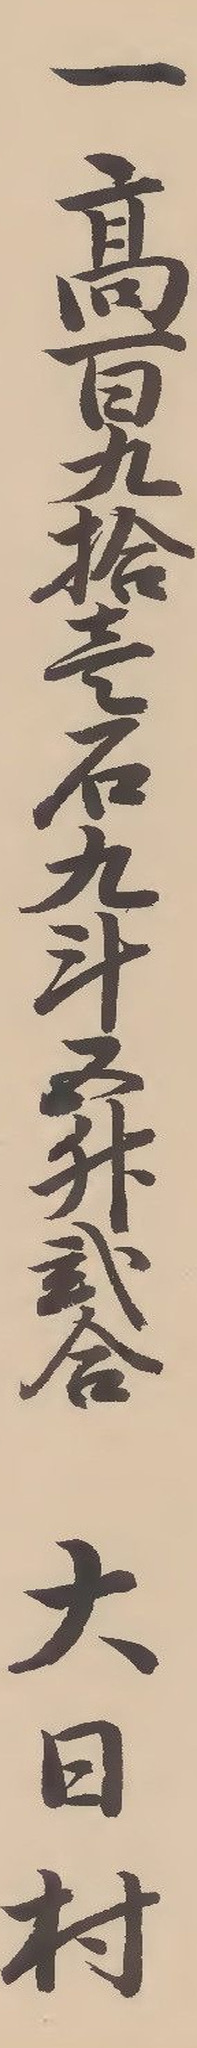一高百九拾壱石九斗五升弐合大日村
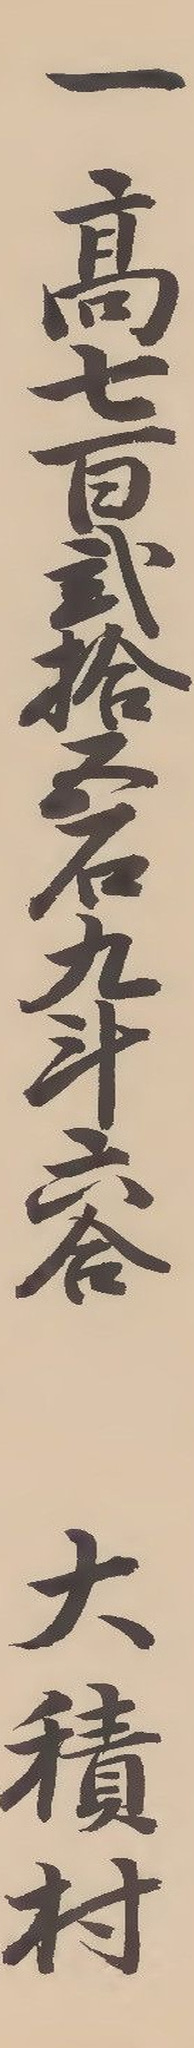一高七百弐拾五石九斗六合大積村
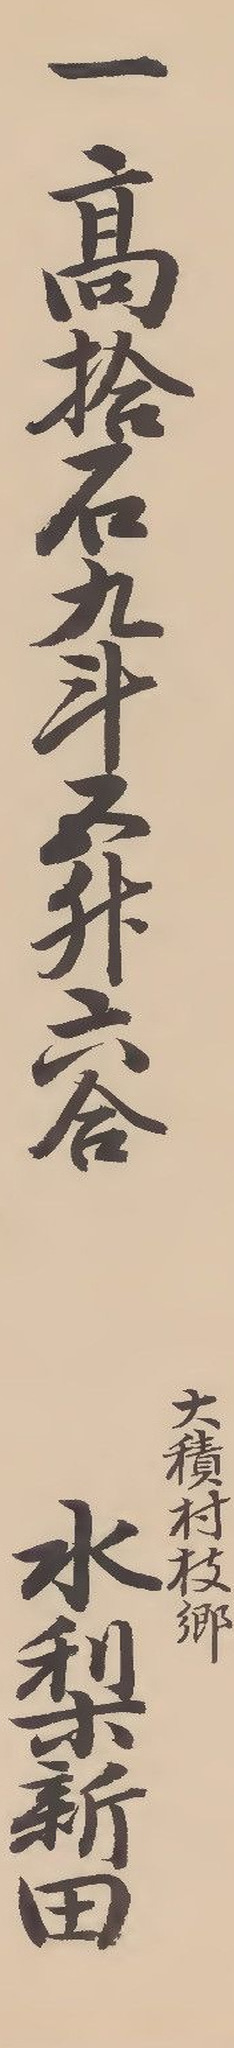一高拾石九斗五升六合水梨新田
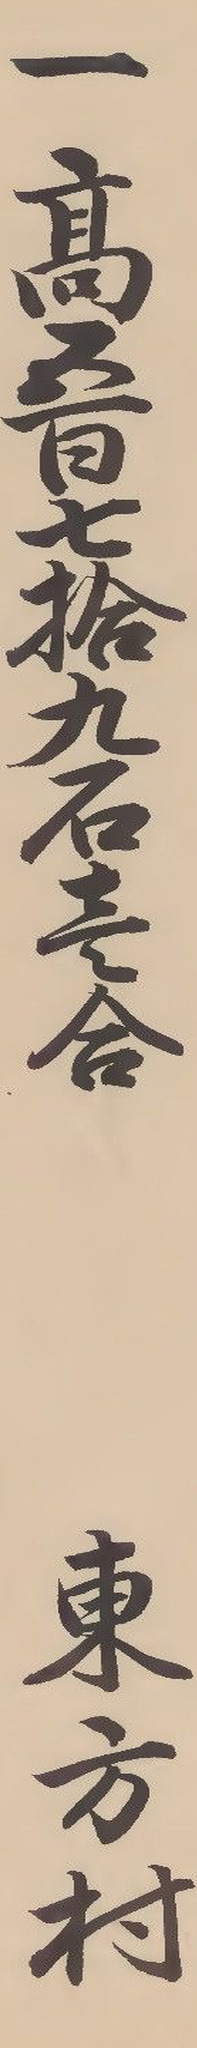一高五百七拾九石壱合東方村
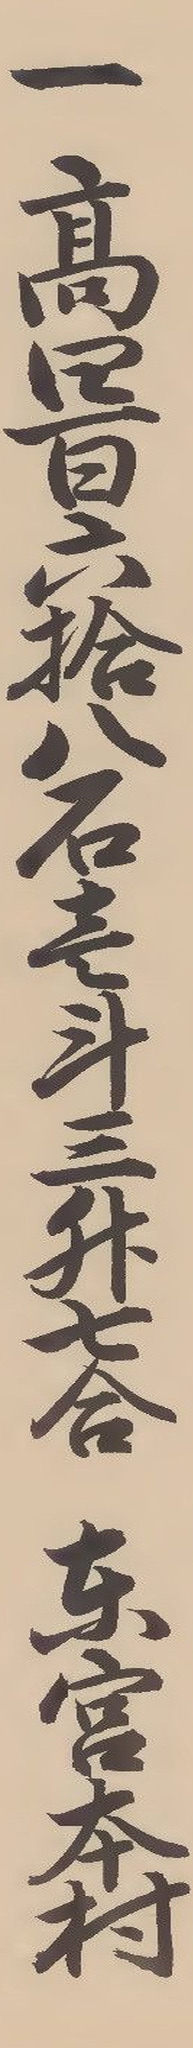一高四百六拾八石壱斗三升七合東宮本村
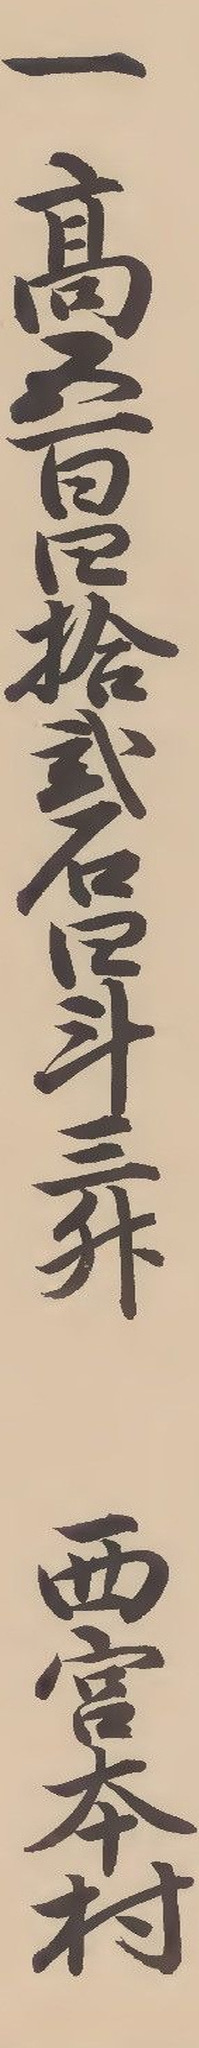一高五百四拾弐石四斗三升西宮本村

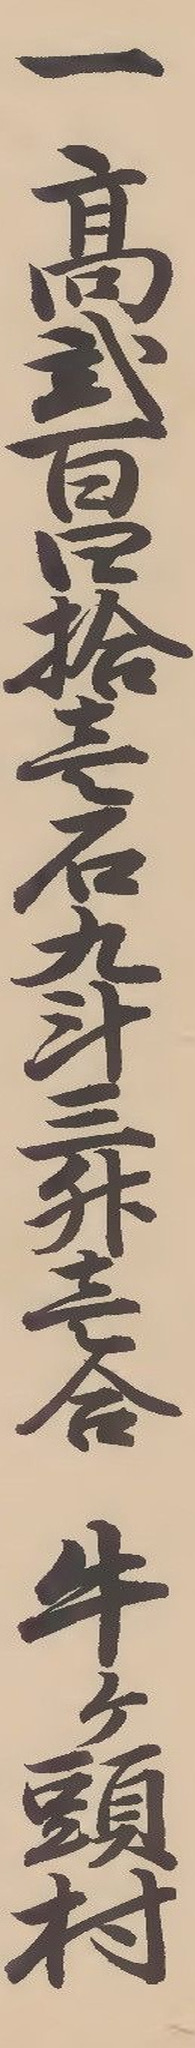一高弐百四拾壱石九斗三升壱合牛ヶ頭村
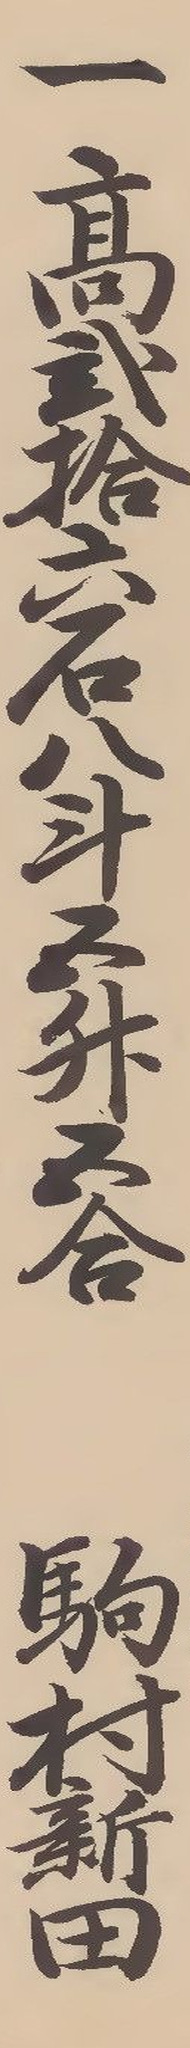一高弐拾六石八斗五升五合駒村新田
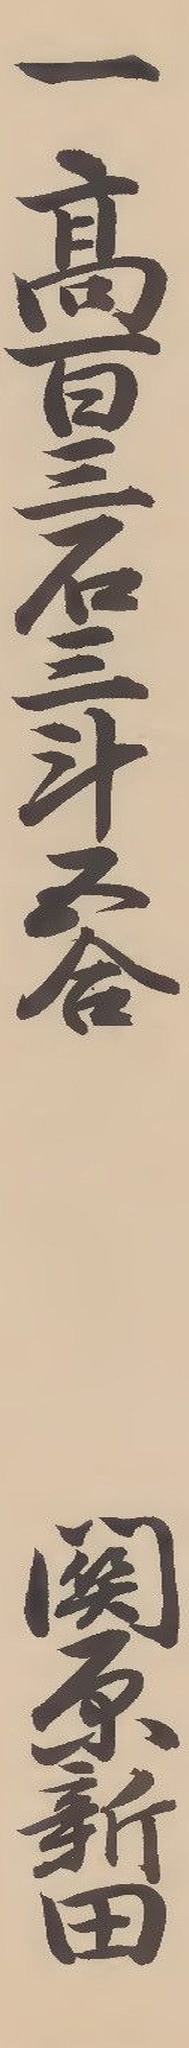一高百三石三斗五合関原新田
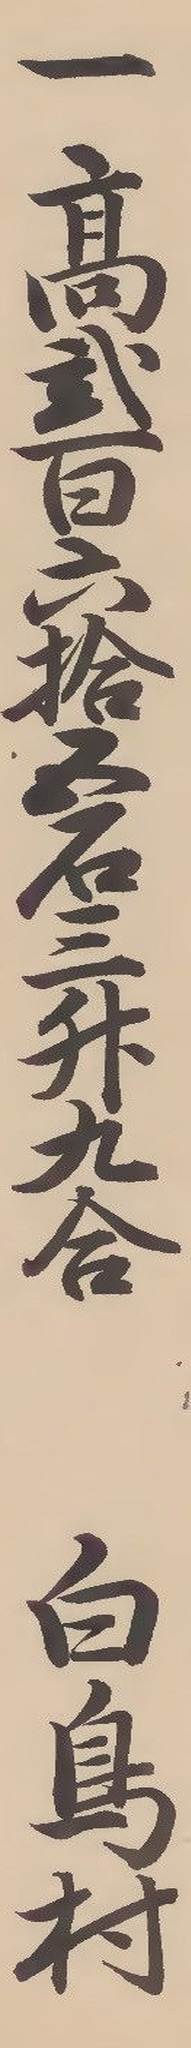一高弐百六拾五石三升九合白鳥村
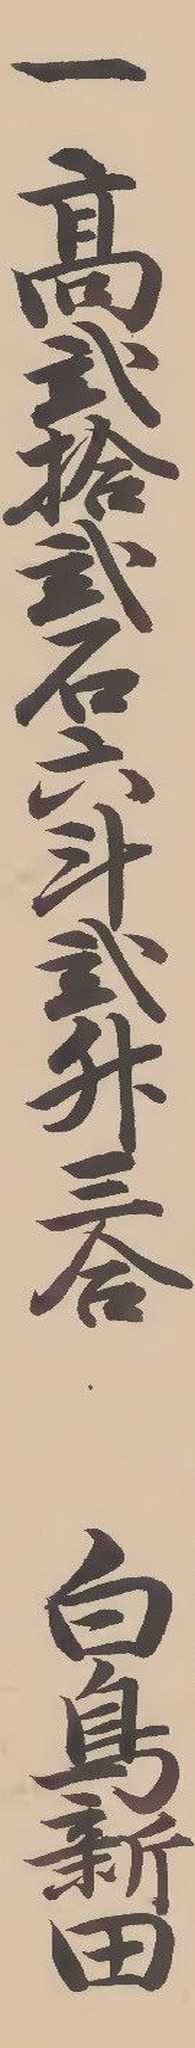一高弐拾弐石六斗弐升三合白鳥新田
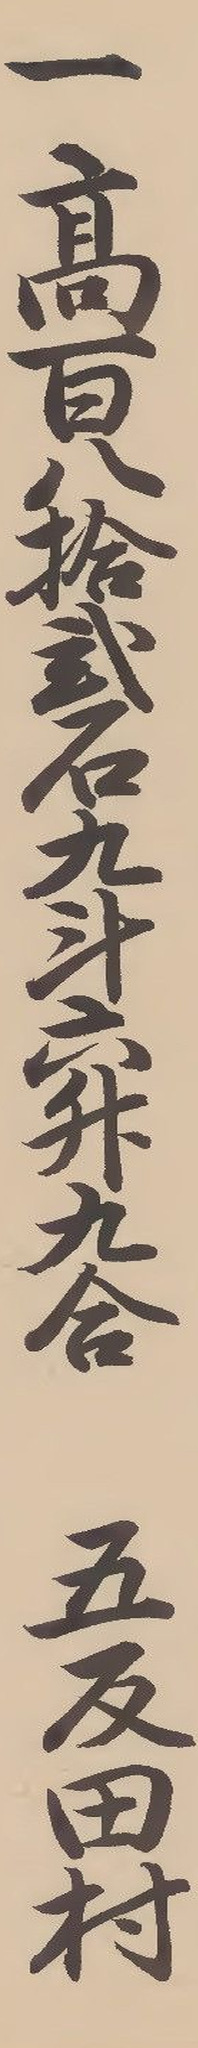一高百八拾弐石九斗六升九合五反田村
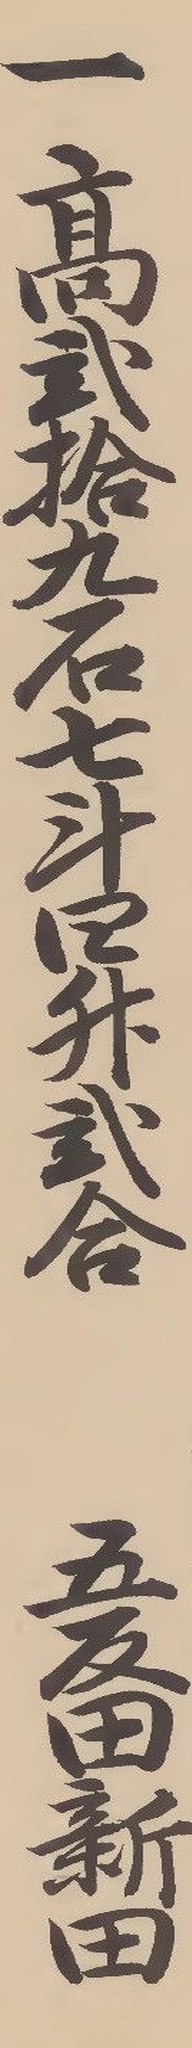一高弐拾九石七斗四升弐合五反田新田
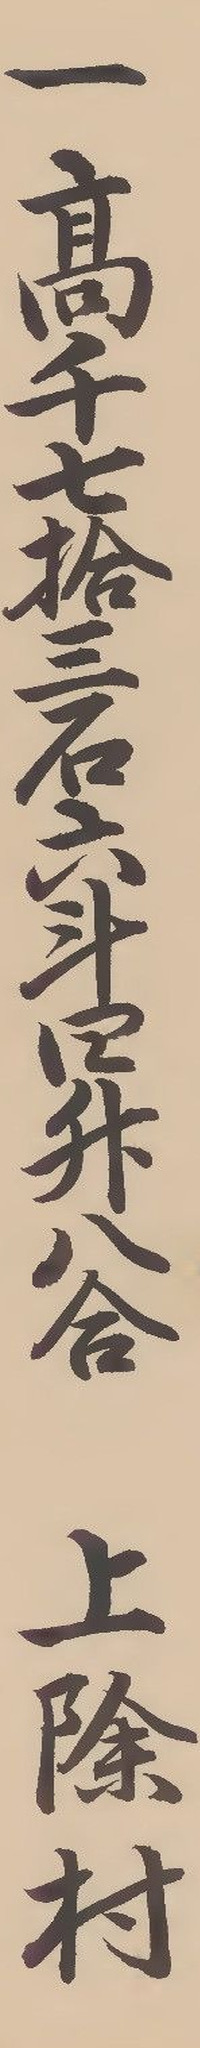一高千七拾三石六斗四升八合上除村

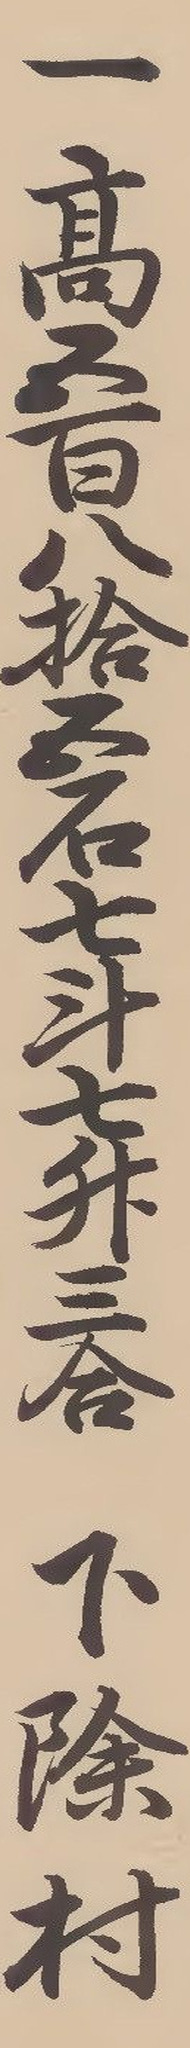一高五百八拾五石七斗七升三合下除村
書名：越後国郷帳　中
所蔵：国立公文書館 National Archives of Japan
